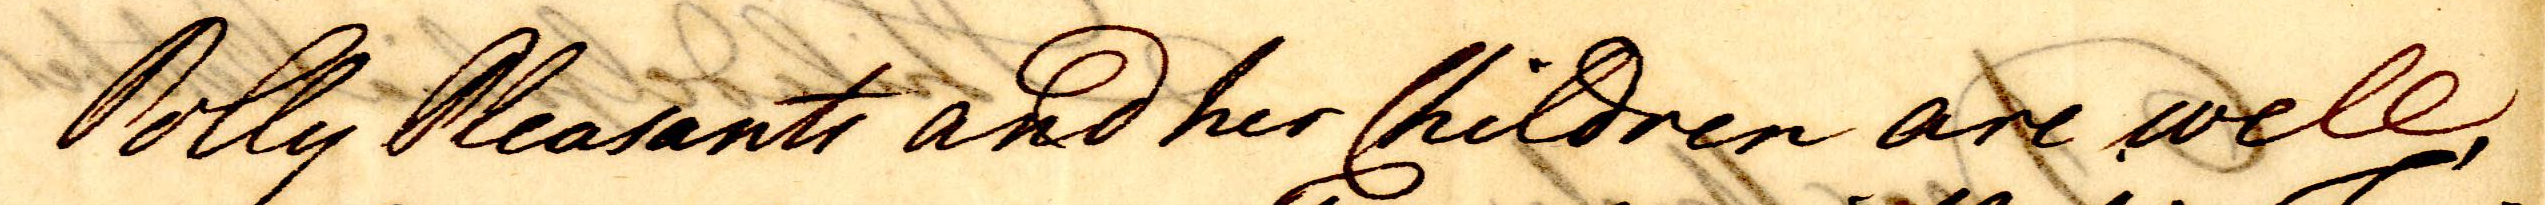Polly Pleasants and her Children are well,
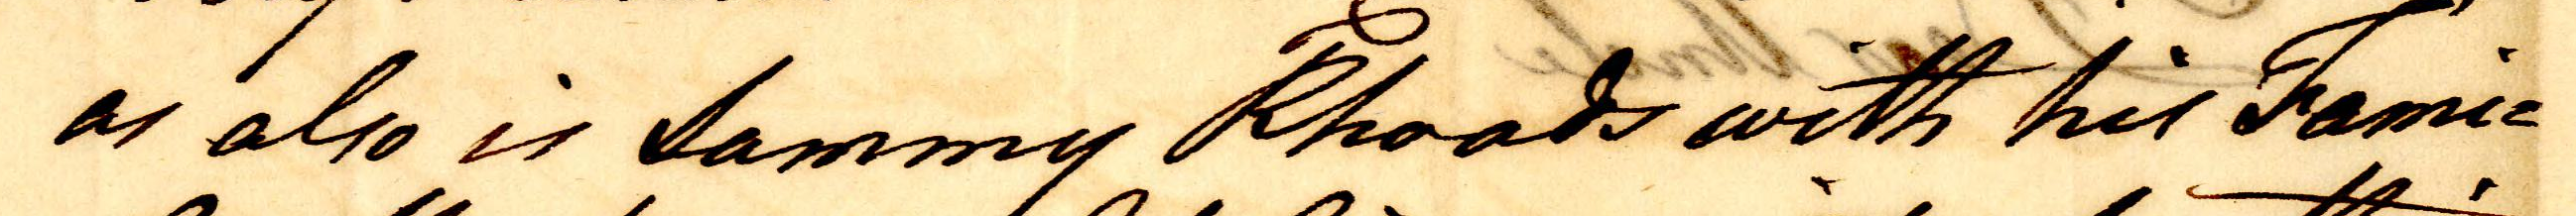as also is Sammy Rhoads with his Fami-
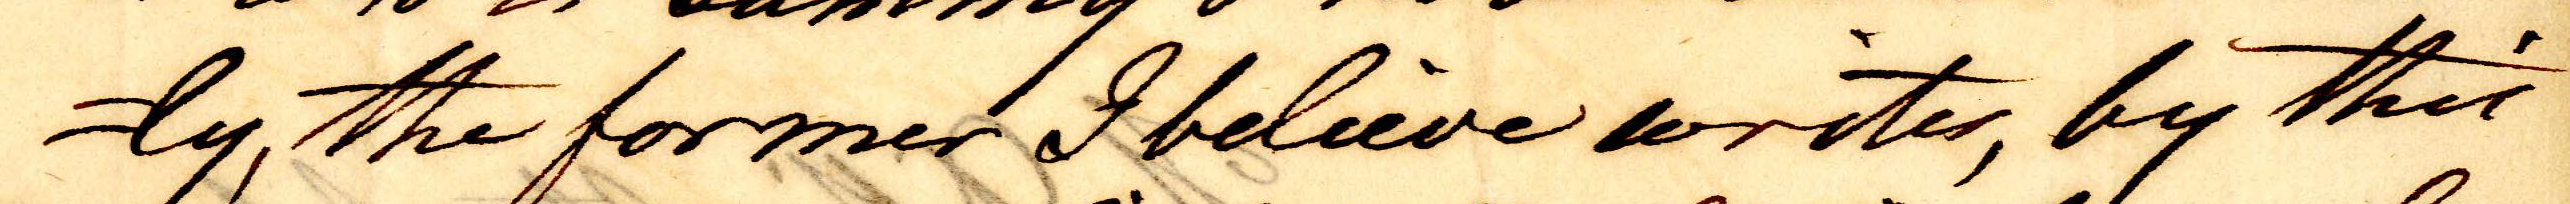-ly, the former I believe writes, by this
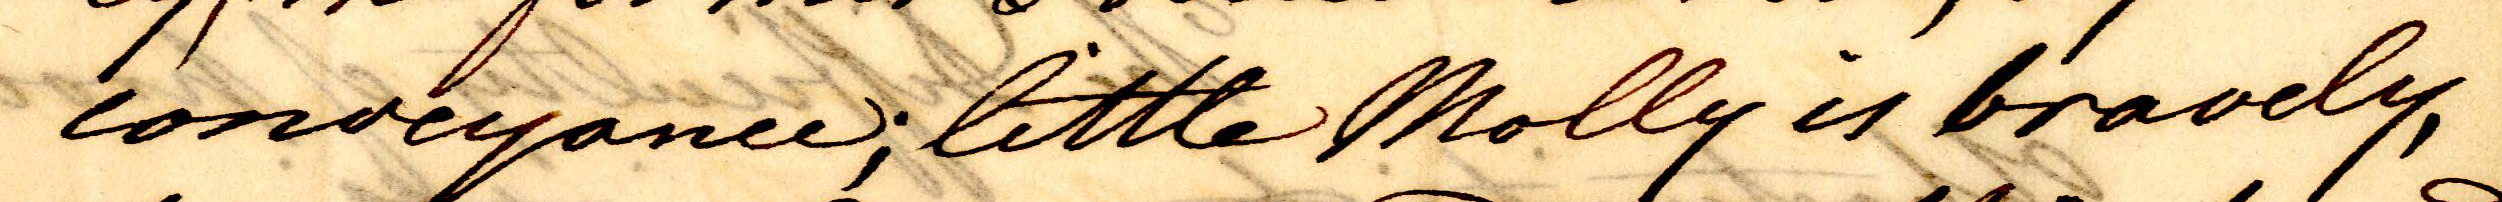conveyance; little Molly is bravely,
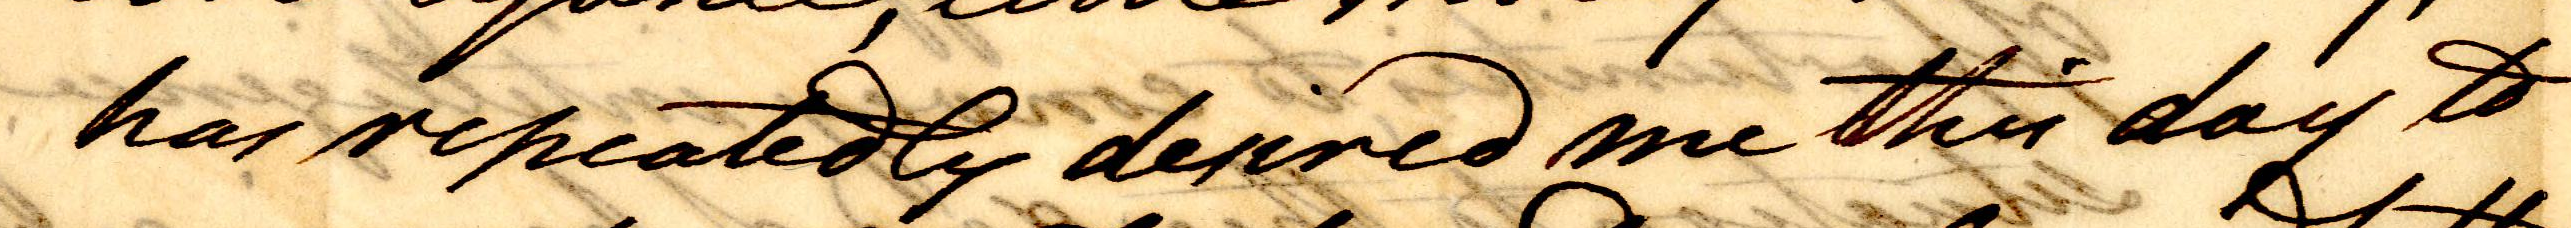has repeatedly desired me this day to
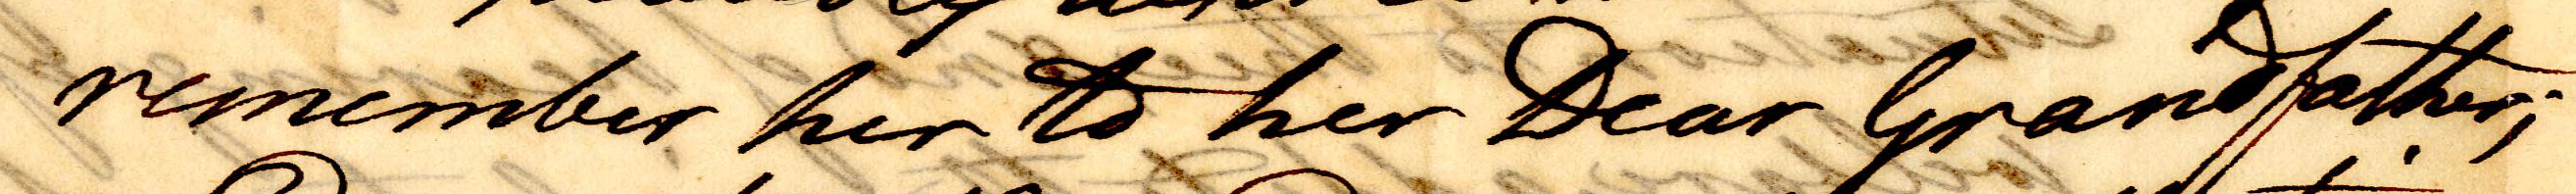remember her to her Dear Grandfather;
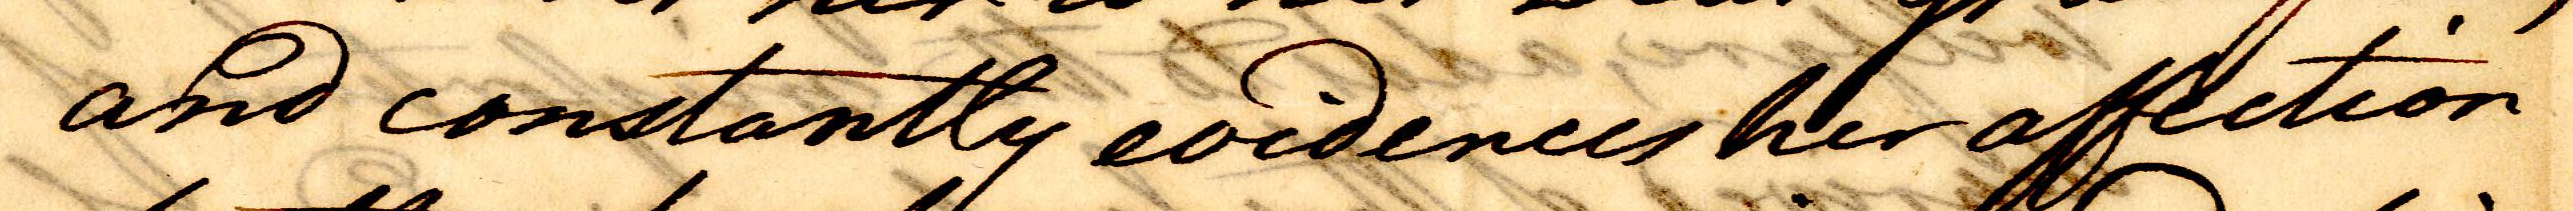and constantly evidences her affection
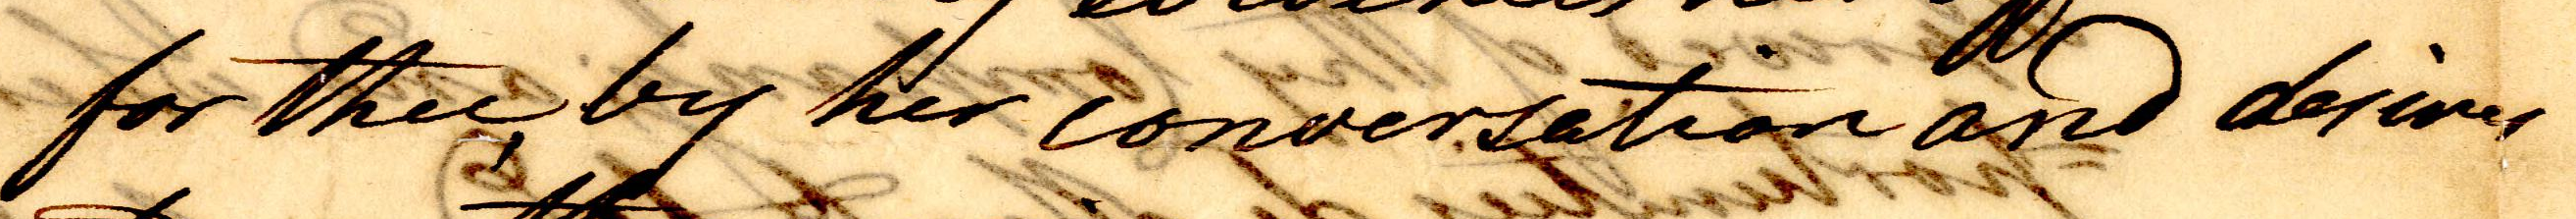for thee by her conversation and desires
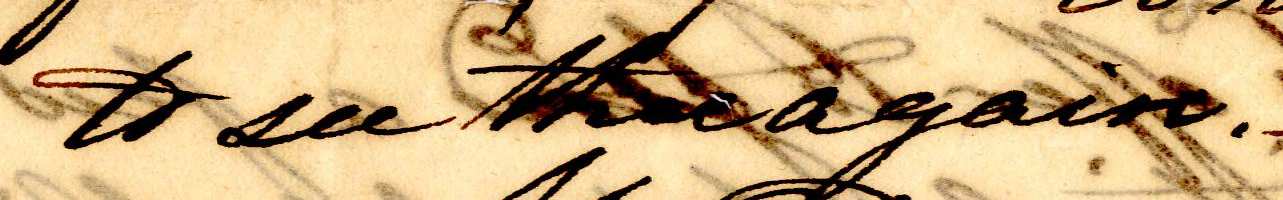to see thee again.
